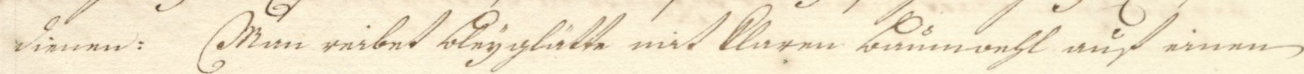dienen: Man reibet Bleyglätte mit klaren Baumoehl auf einen
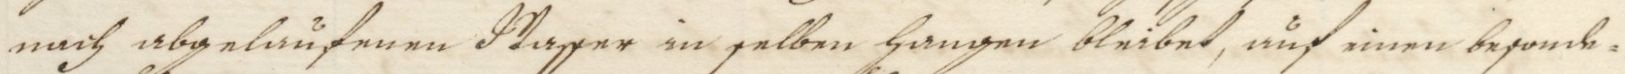nach abgelaufenen Wasser in selben hangen bleibet, auf einen besonde-
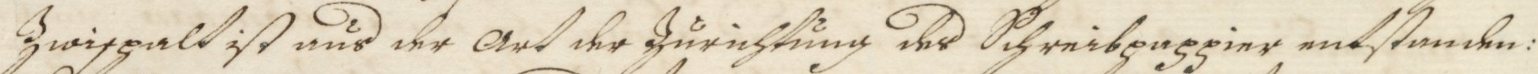Zwispalt ist aus der Art der Zurichtung des Schreibpappier entstanden:
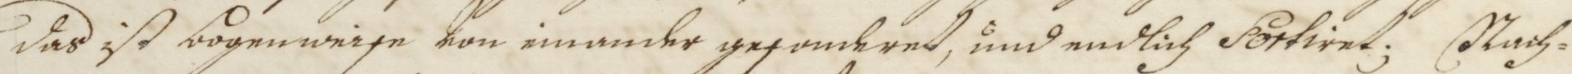das ist Bogenweise von einander gesonderet, und endlich Sortiret. Nach-
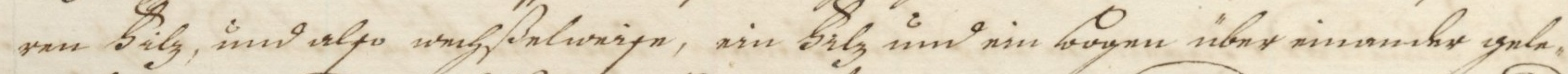ren Filz, und also wechßelweise, ein Filz und ein Bogen über einander gele-
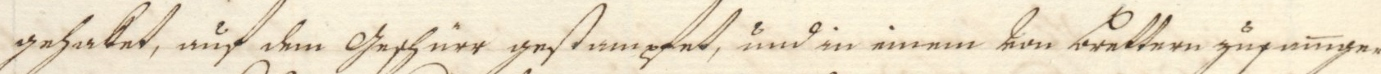gehaket, auf dem Geschürr gestampfet, und in einem von Brettern zugammge-
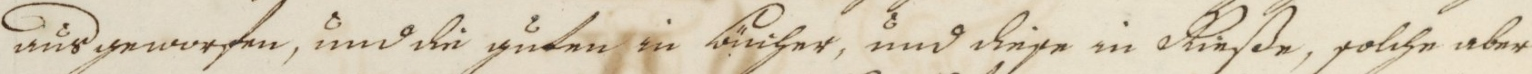ausgeworfen, und die guten in Bücher, und diese in Rieße, solche aber
